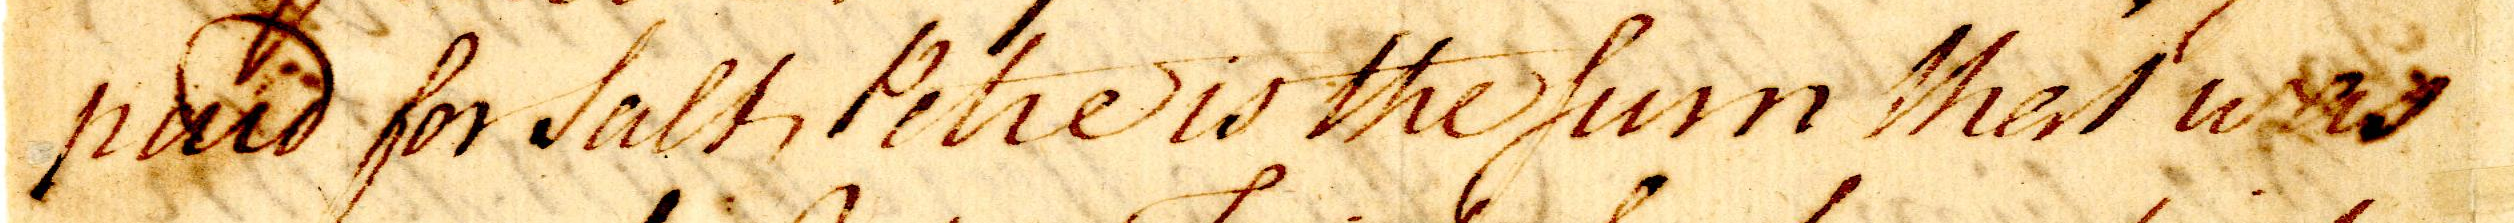paid for salt Petre is the Sum that was
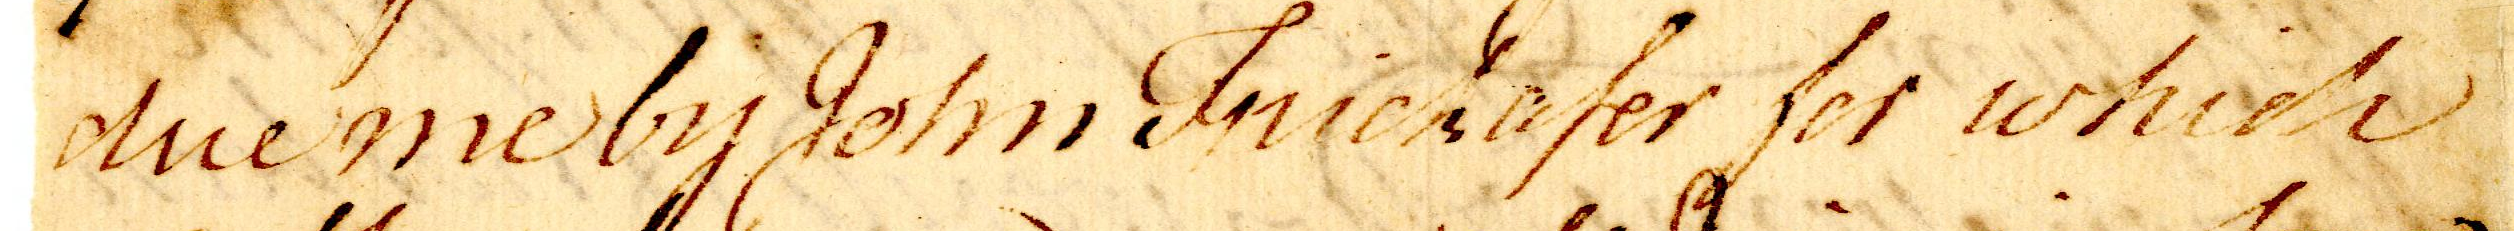due me by John Frickafer for which
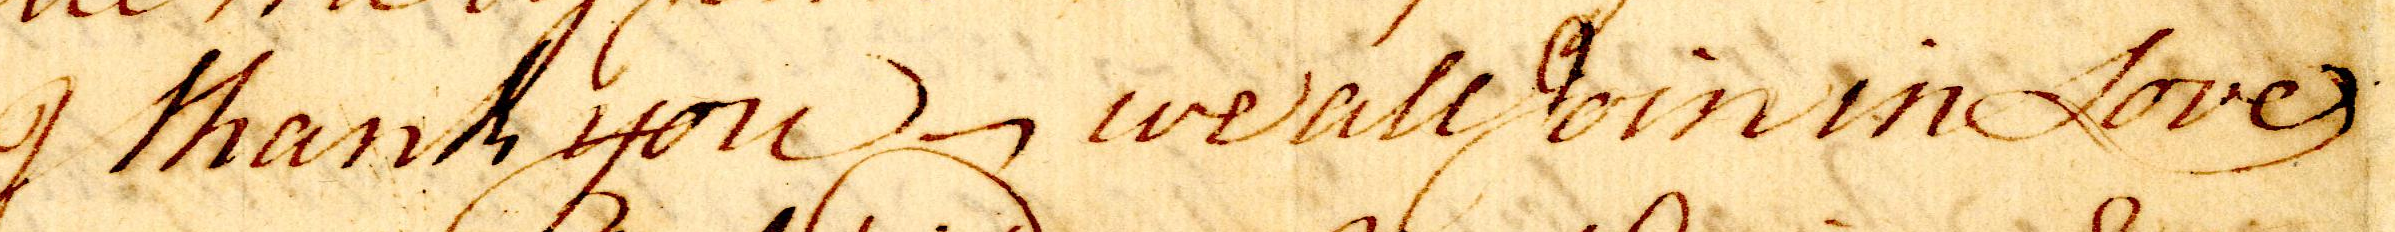I thank you- we all join in Love
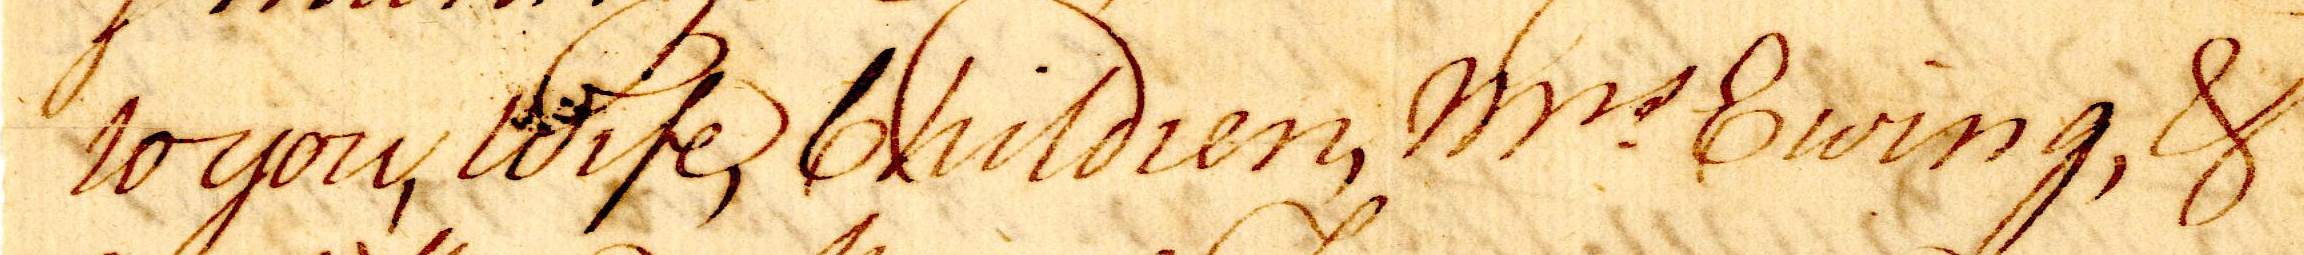to you, Wife, Children, M^rs. Ewing, &
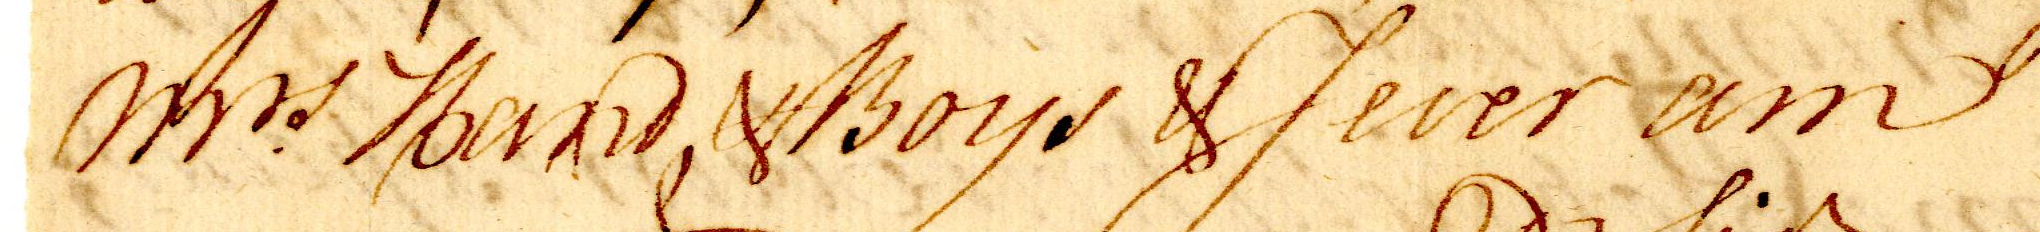M^rs. Hand, & Boys & I ever am
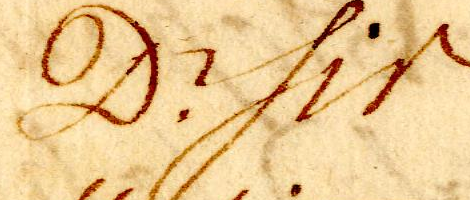D^r Sir
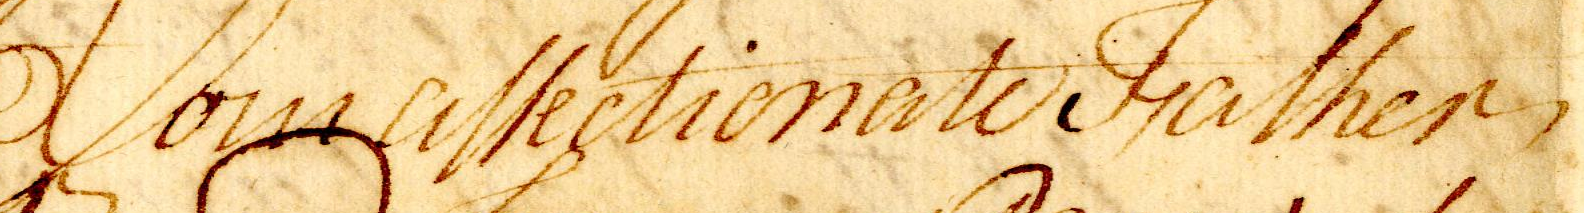Your affectionate Father
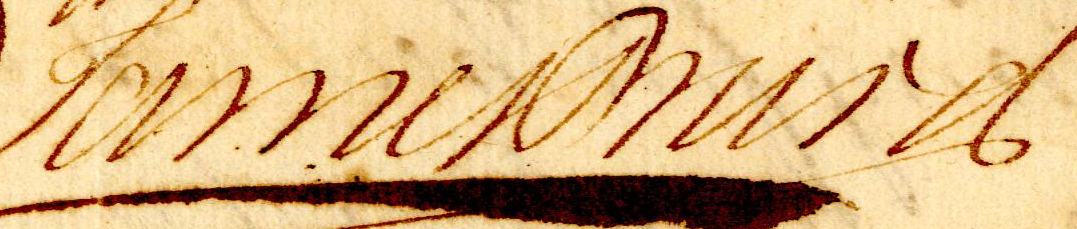James Burd
